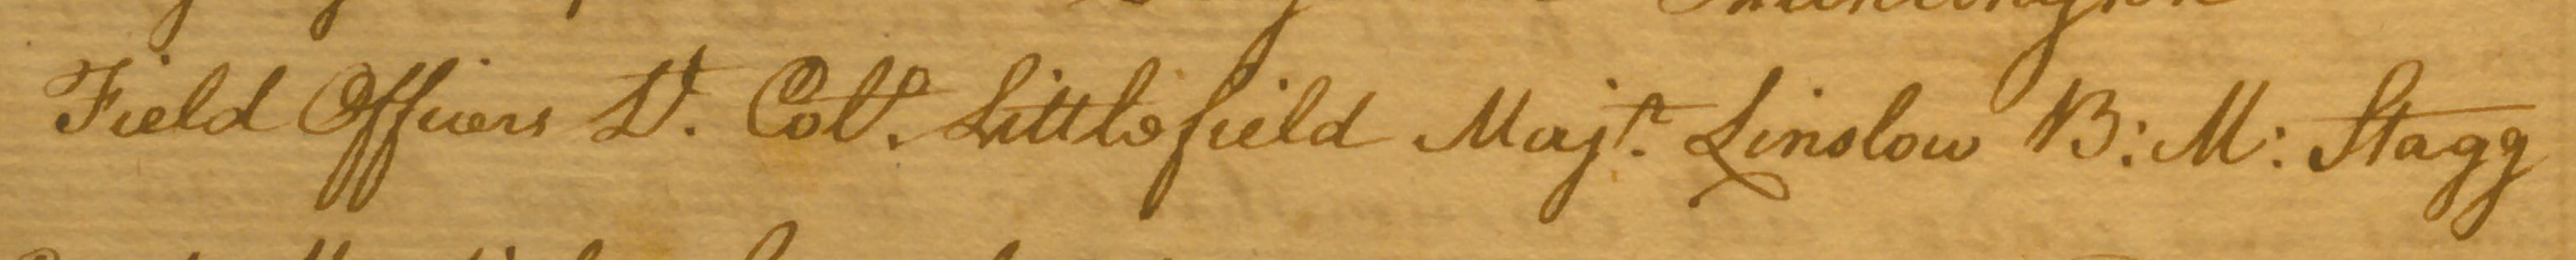Field Officers L^t. Col^o. Littlefield Maj^r. Linslow B: M: Stagg
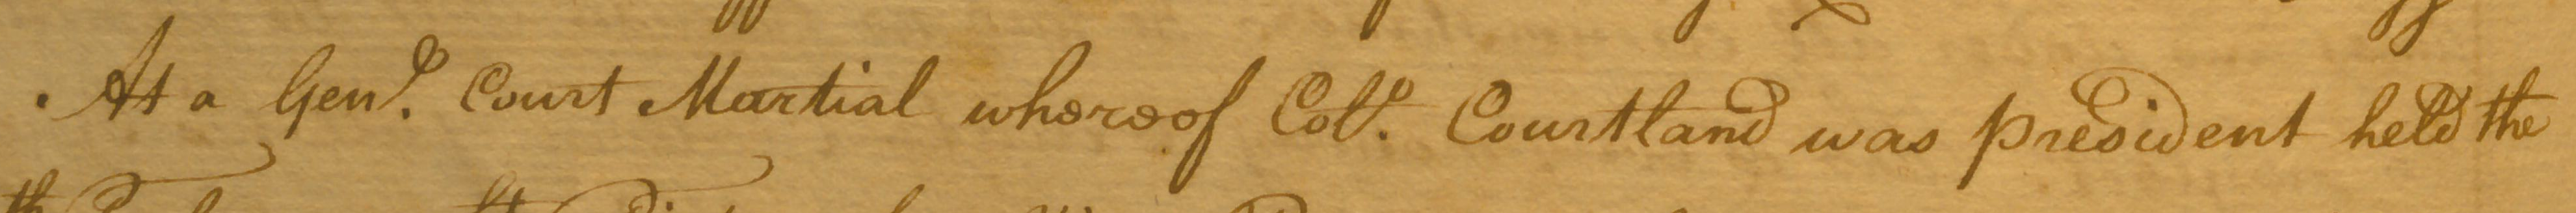At a Gen^l. Court Martial whereof Col^o. Courtland was president held the
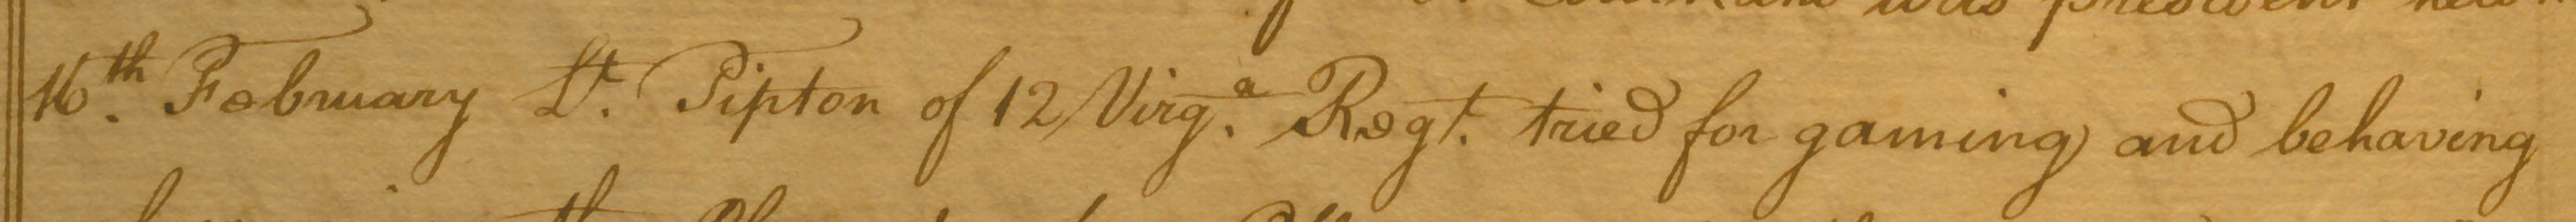16^th. February L^t. Pipton of 12 Virg^a. Reg^t. tried for gaming and behaving
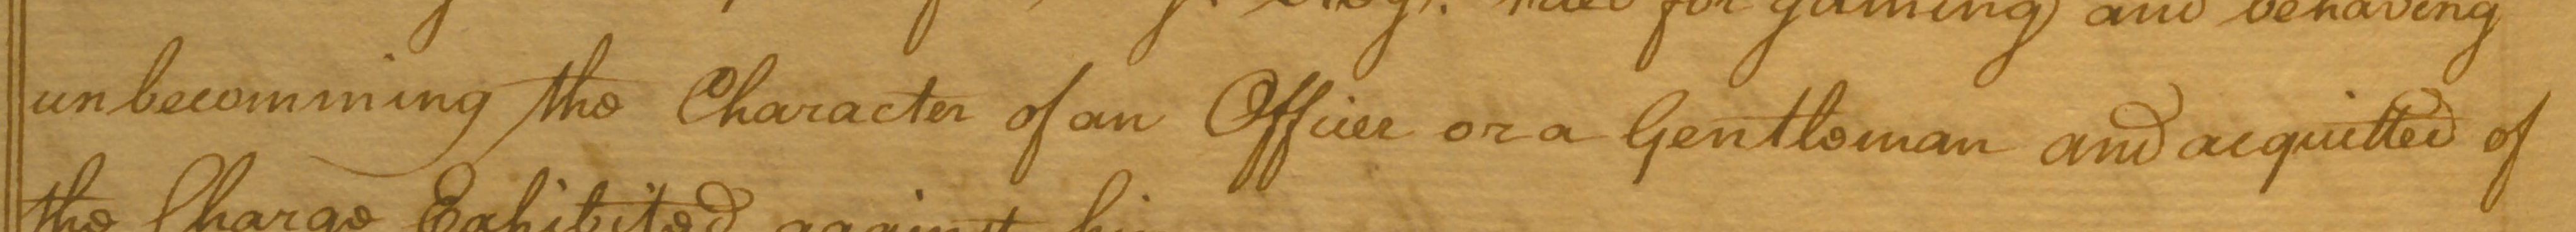unbecoming the Character of an Officer or a Gentleman and acquitted of
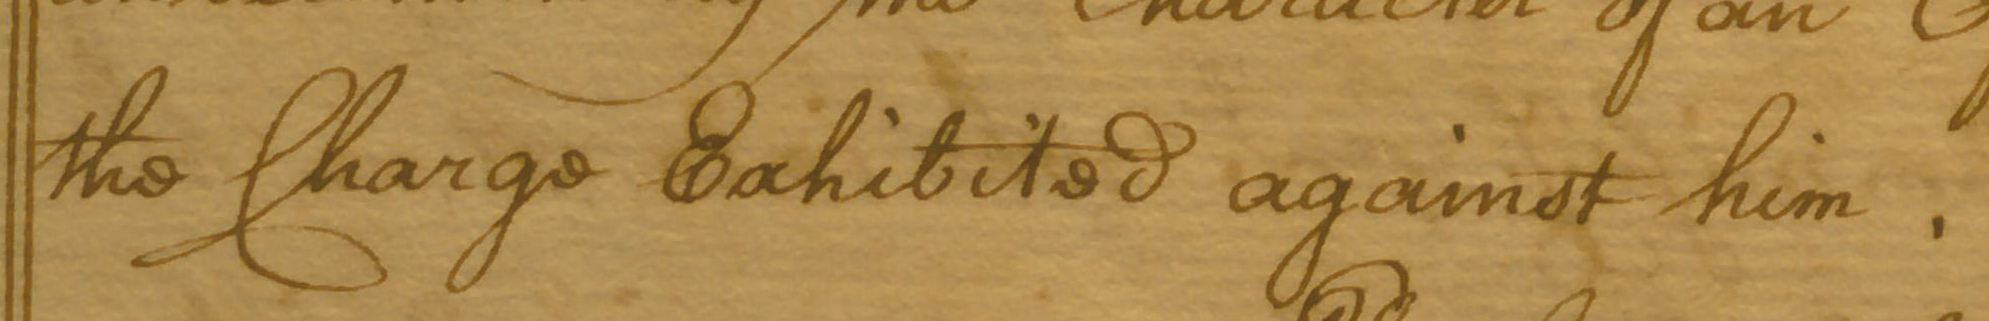the Charge Exhibited against him.
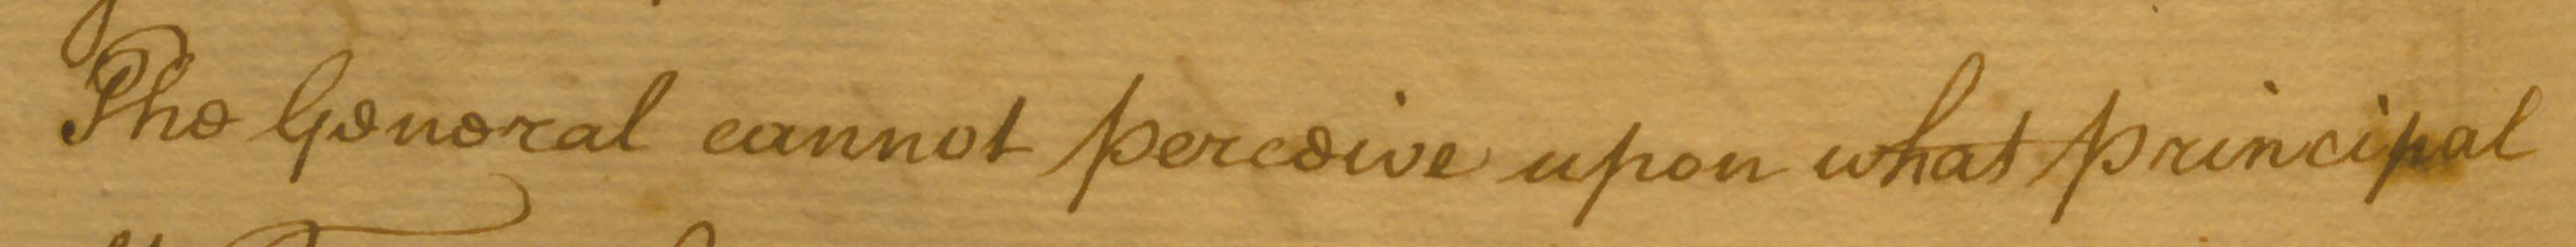The General cannot perceive upon what principal
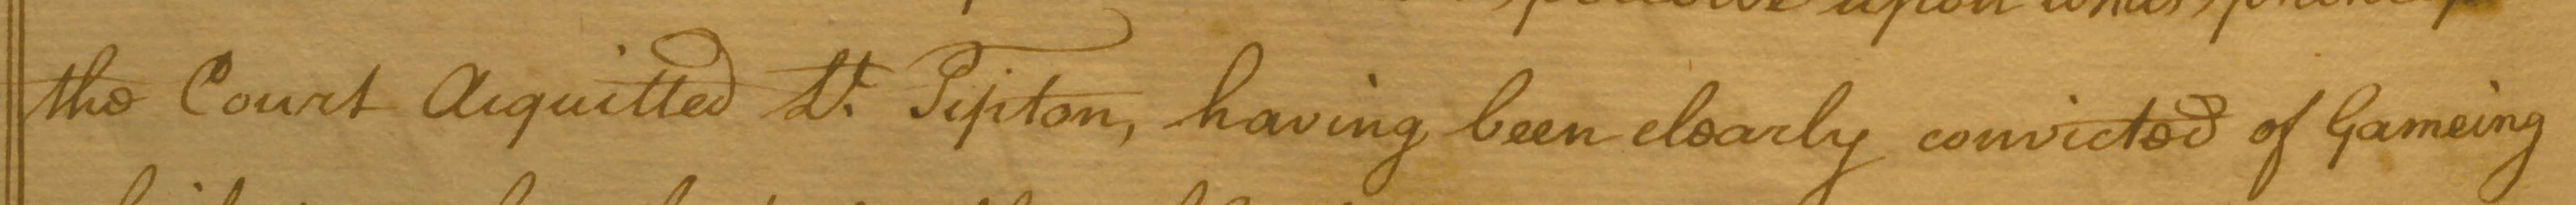the Court Acquitted L^t. Pipton, having been clearly convicted of Gameing
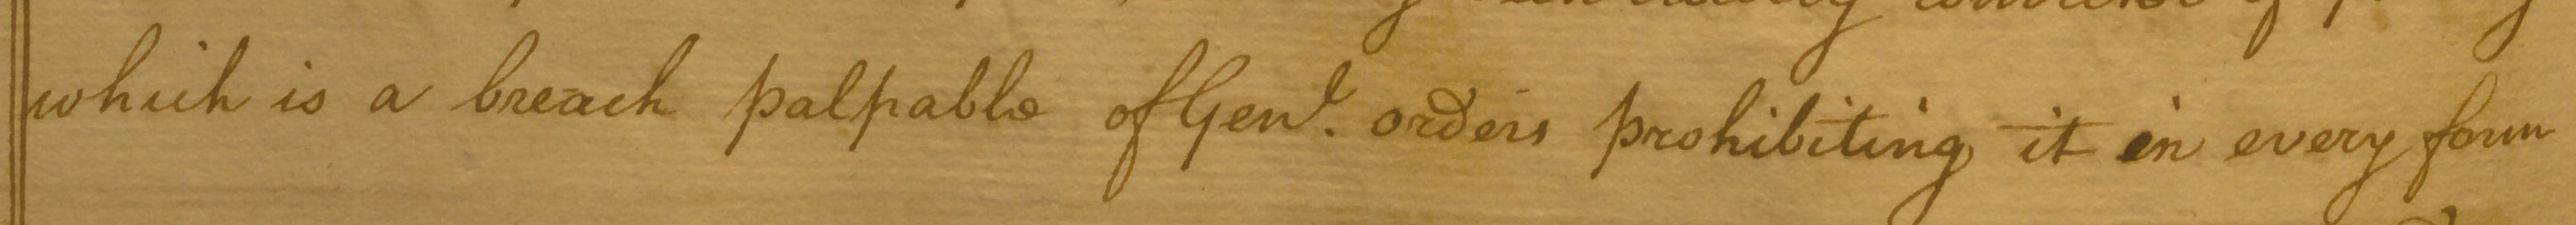which is a breach palpable of Gen^l. orders prohibiting it in every form
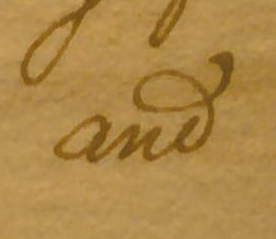and
